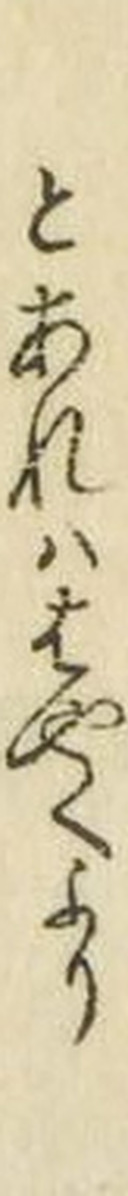とあれははやくより
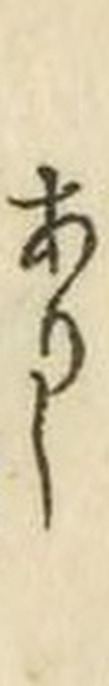ありし
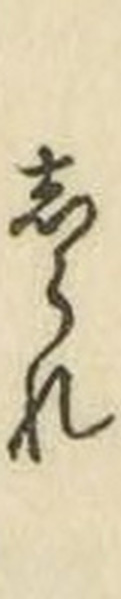しられ

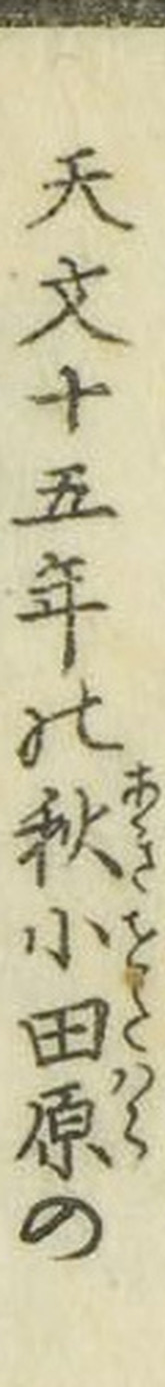天文十五年の秋小田原の
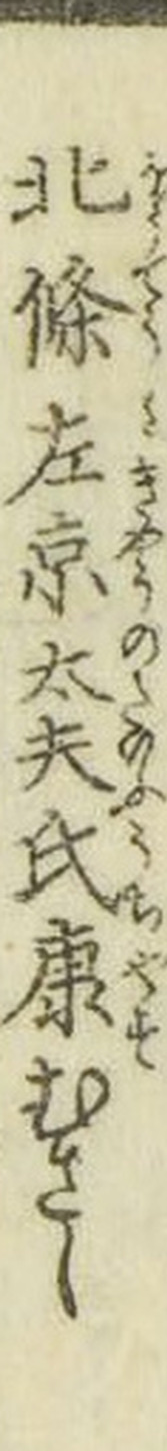北条左京太夫康むさし
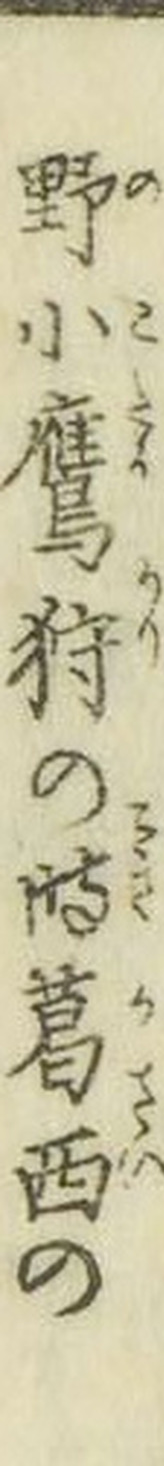野小鷹狩の時葛西の
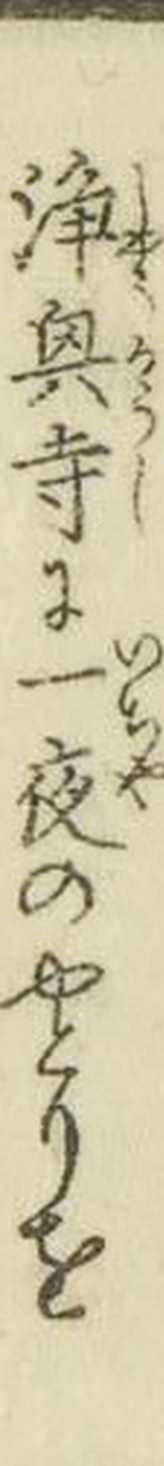浄興寺に一夜のやとりを
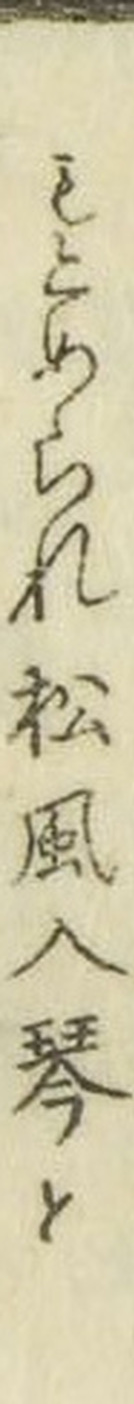もとめられ松風入琴と
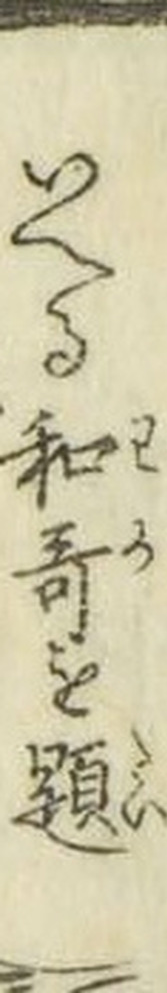いへる和歌を題に
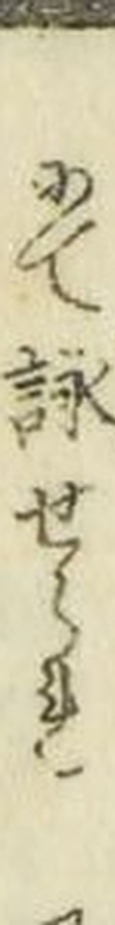にて詠せられ
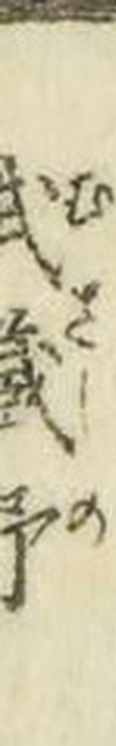武蔵野
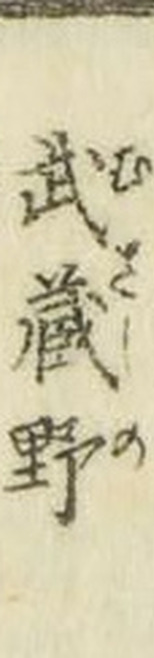武蔵野
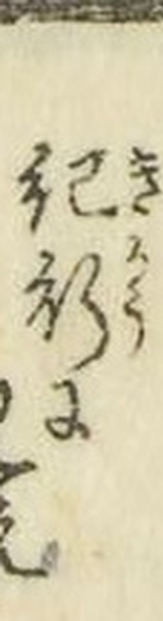紀行に
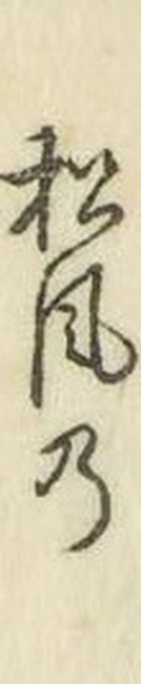松風の
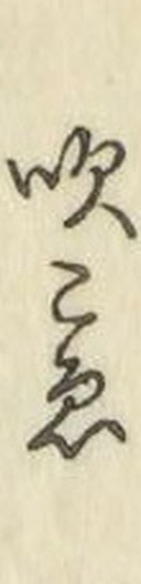吹こゑ
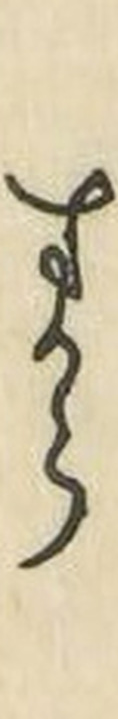すから
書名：江戸名所図会 20巻 巻之19
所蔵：東京学芸大学教育コンテンツアーカイブ
